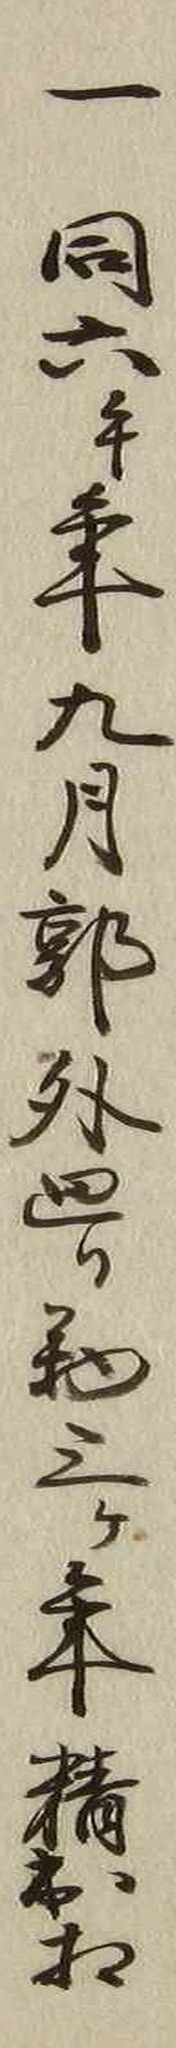一同六午年九月郭外廻り勤三ケ年精出相
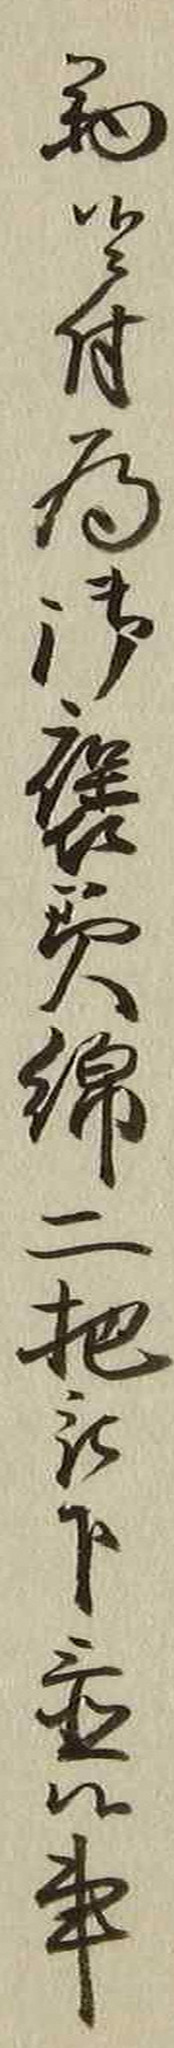勤候ニ付為御褒美綿二把被下置候事
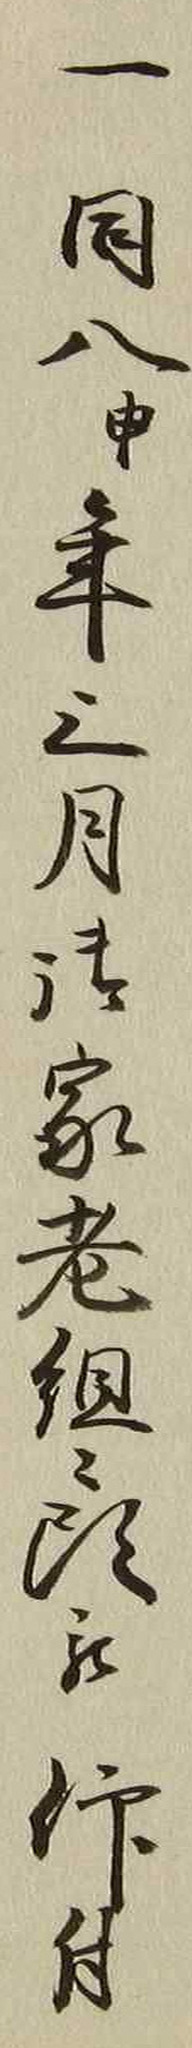一同八申年三月御家老組々頭被仰付
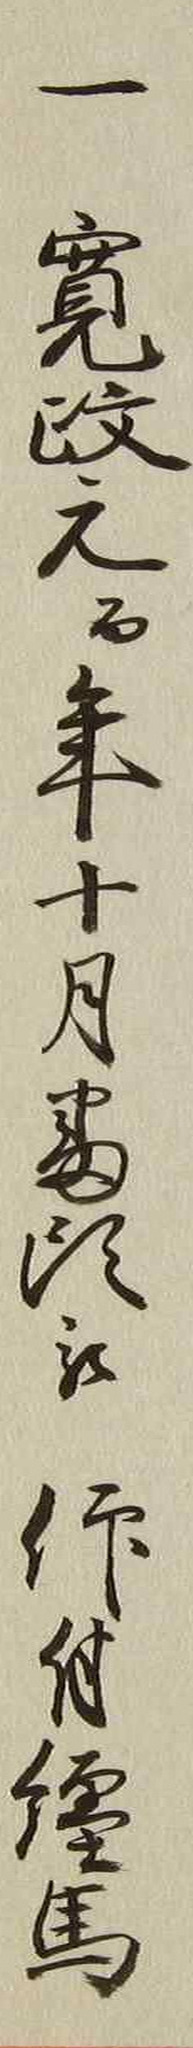一寛政元酉年十月番頭被仰付纏馬
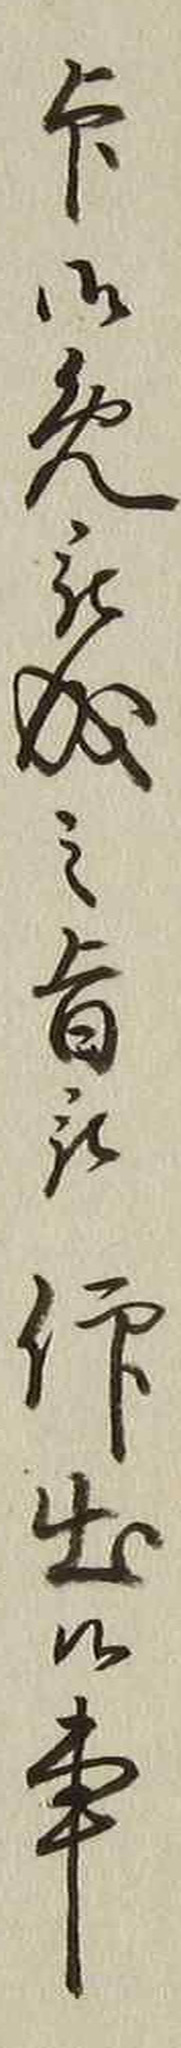印御免被成之旨被仰出候事
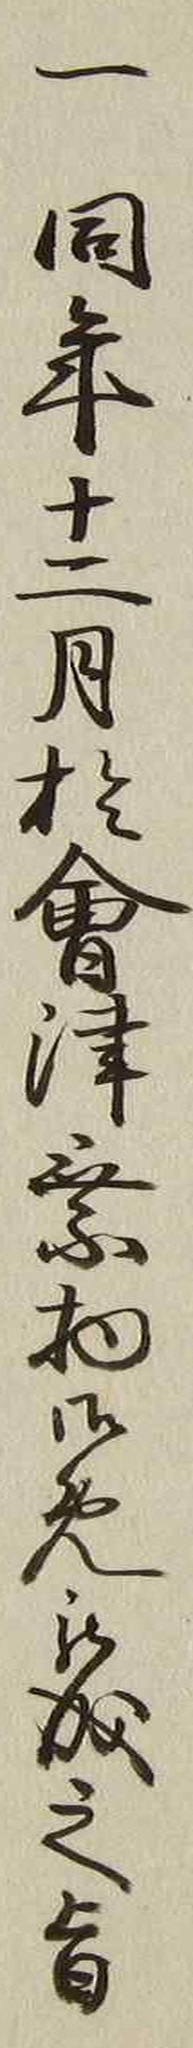一同年十二月於会津乗物御免被成之旨
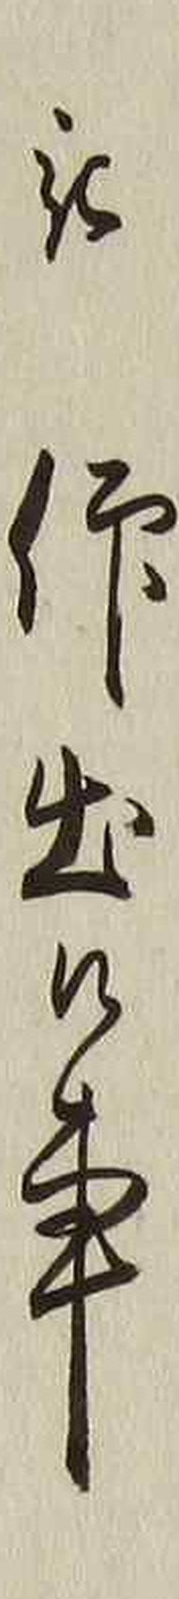被仰出候事
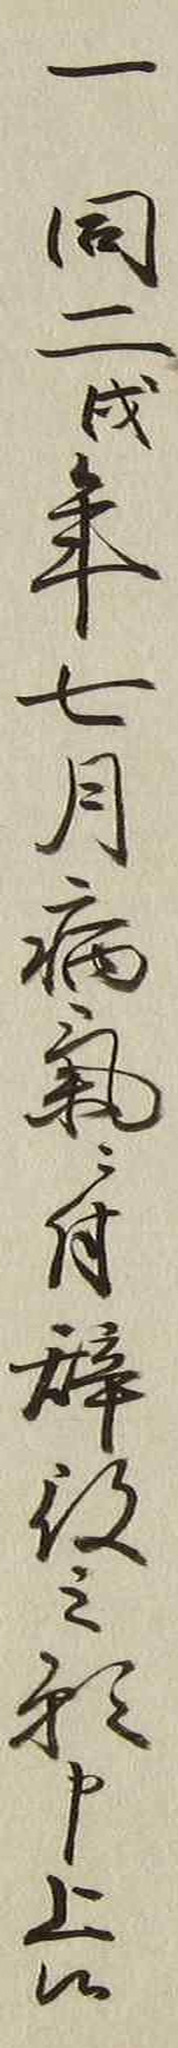一同二戌年七月病気付ニ付辞役之願申上候
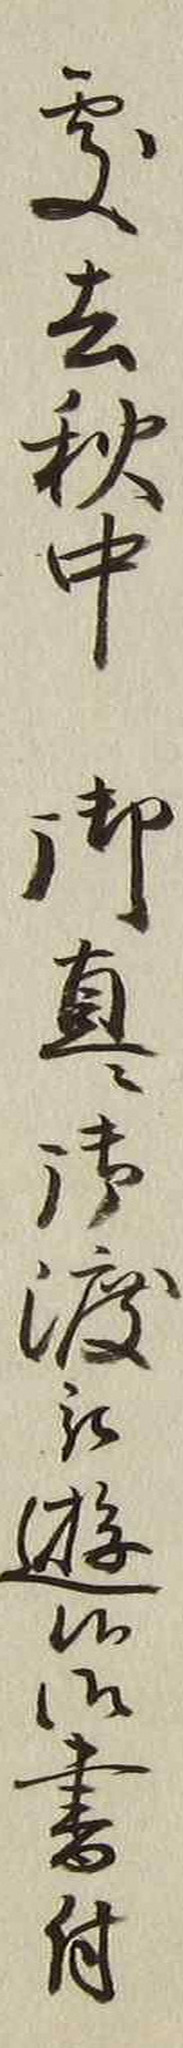処去秋中御直ニ御渡被遊候御書付
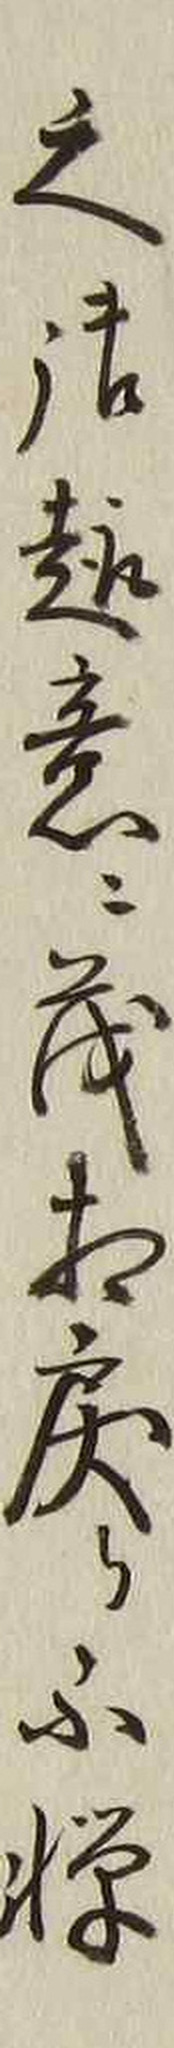之御趣意ニも相戻り不憚
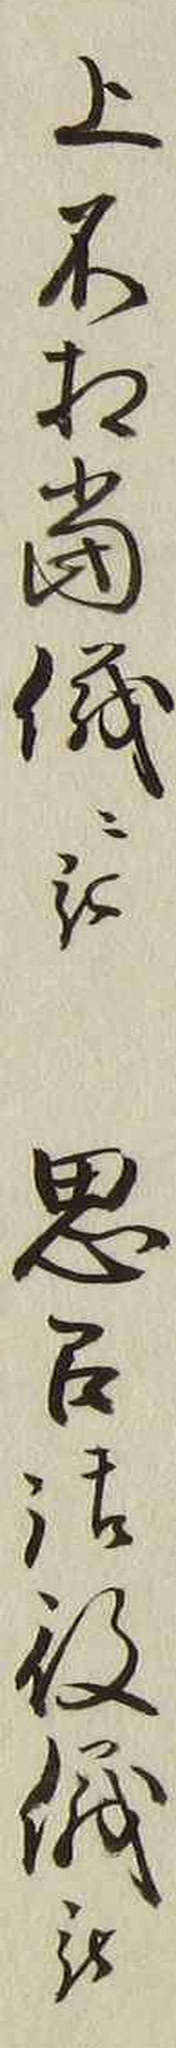上不相当儀ニ被思召御役儀被
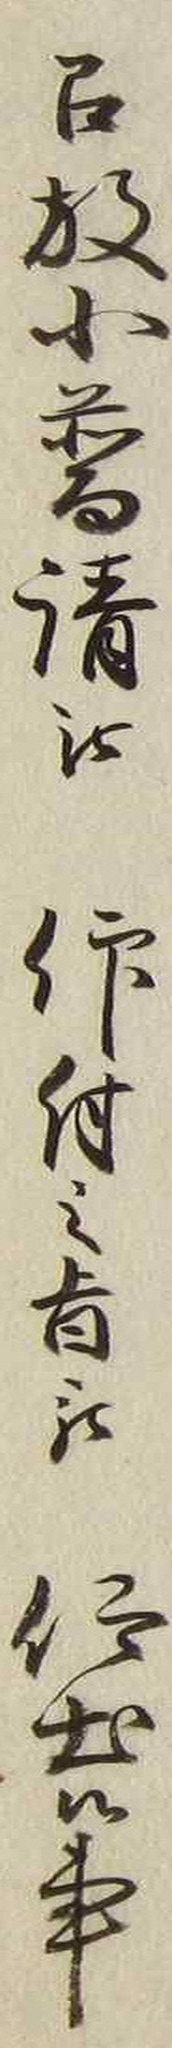召放小普請被仰付之旨被仰出候事

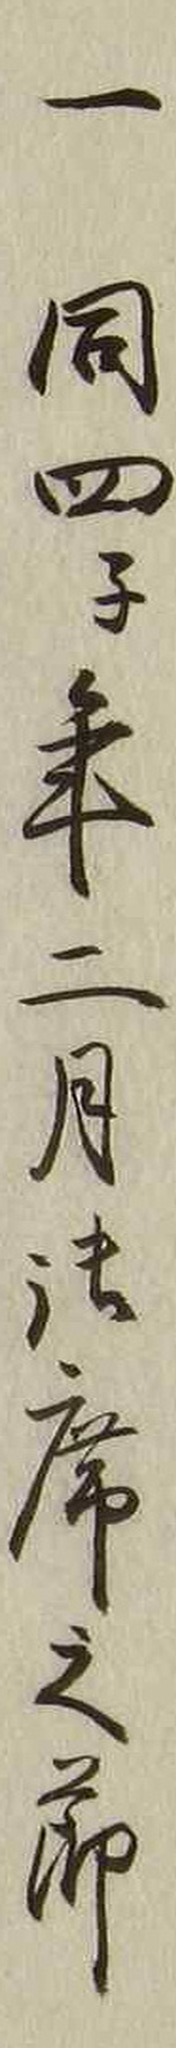一同四子年二月御席之節
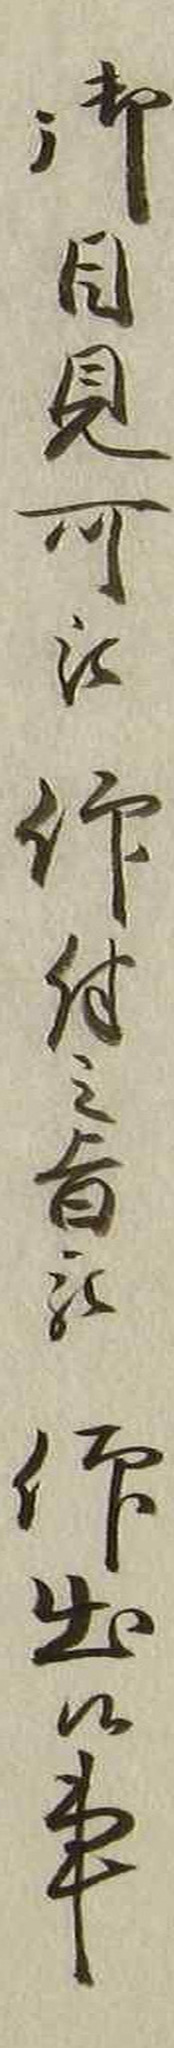御目見可被仰付之旨被仰出候事
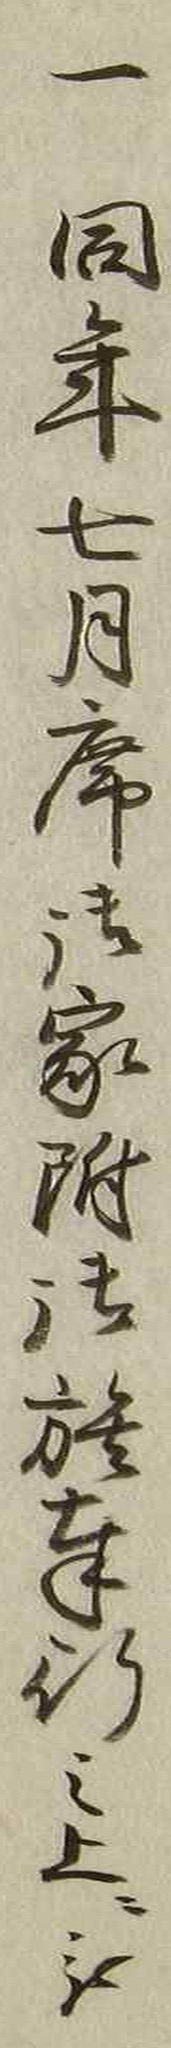一同年七月席御家附御旗奉行之上ニ被
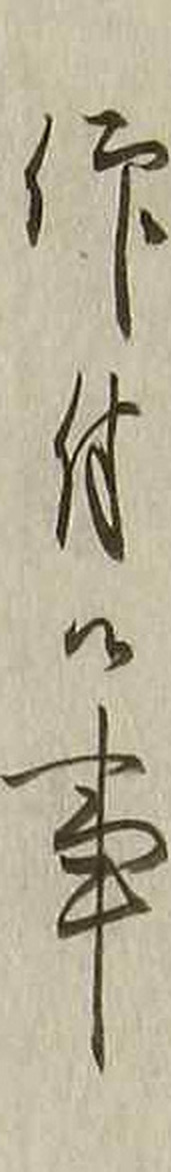仰付候事
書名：諸士系譜　巻之15　い之部15
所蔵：会津若松市立会津図書館
